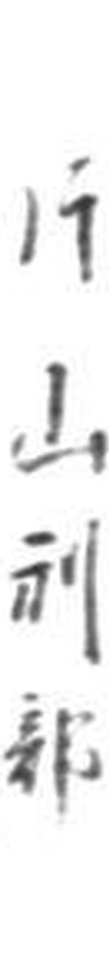片山刑部
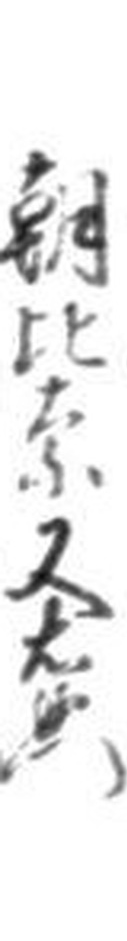朝比奈又右衛門
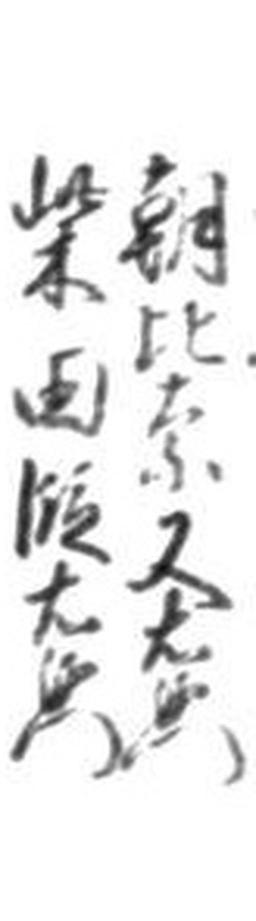柴田段右衛門

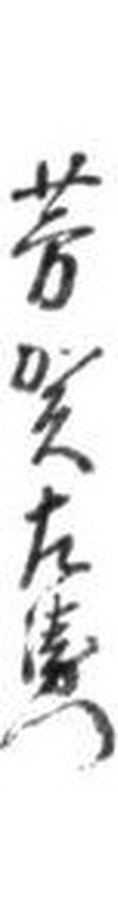芳賀左衛門
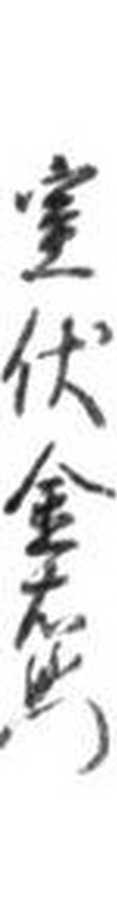室伏金右衛門
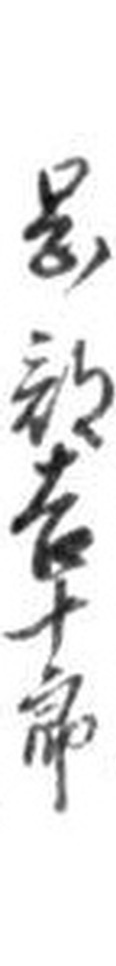岡部吉十郎
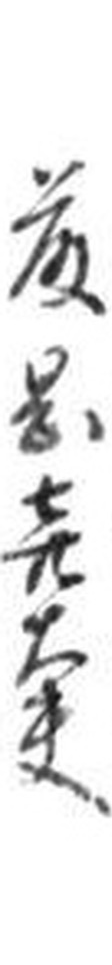藤岡喜大夫
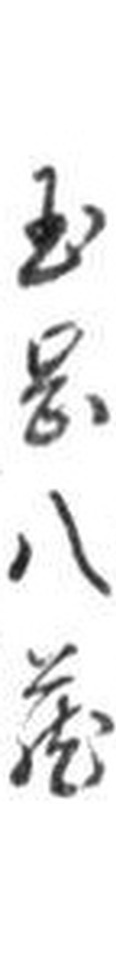玉岡八蔵
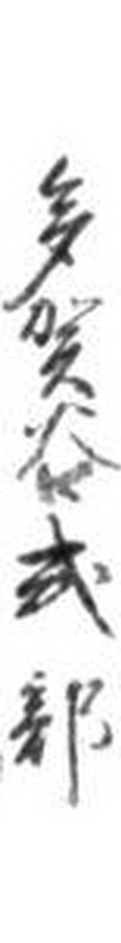多賀谷式部
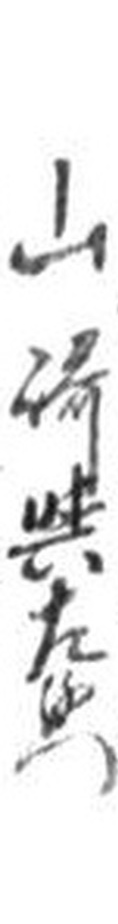山崎与左衛門
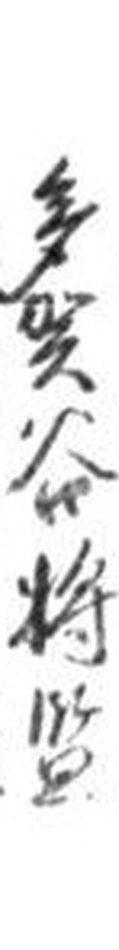多賀谷将監
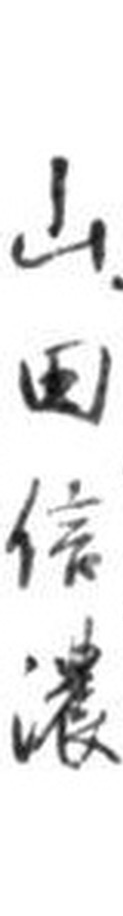山田信濃
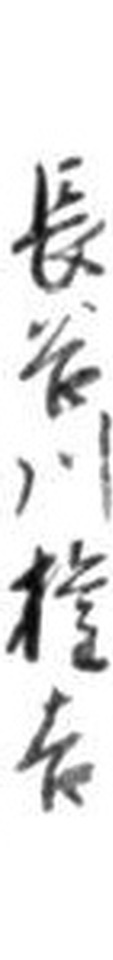長谷川権吉
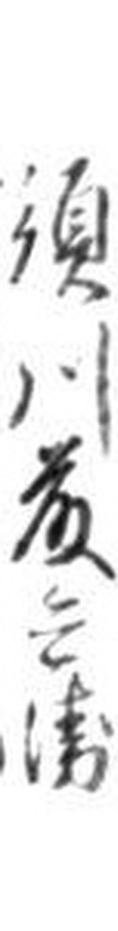須川藤兵衛
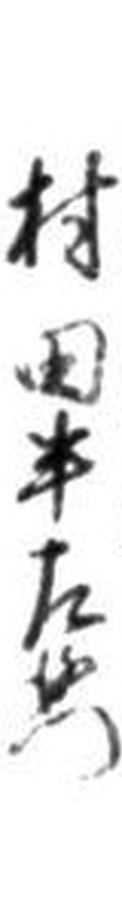村田半左衛門
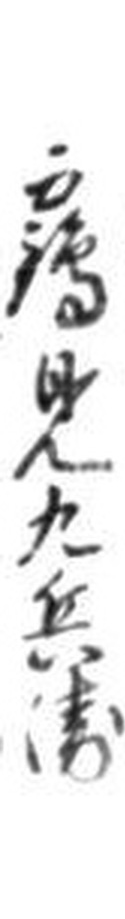鶴見九兵衛
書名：家譜 二 忠直公 従文禄四年到慶安四年
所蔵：福井県文書館 Fukui Prefectural Archives
